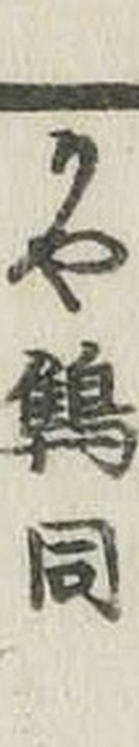かや鶽同
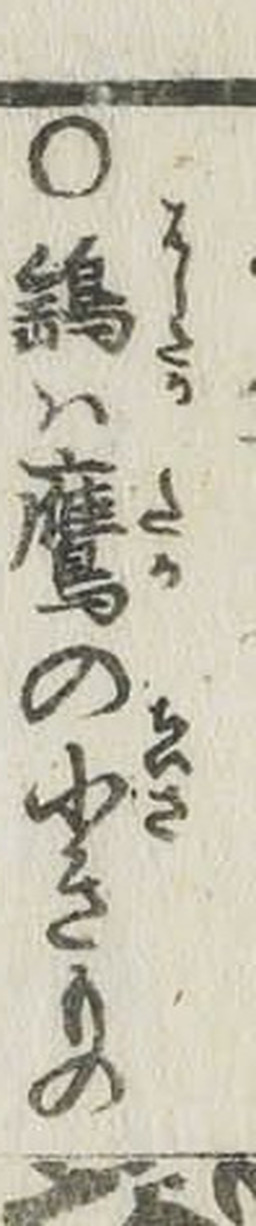○鷂は鷹の小きもの
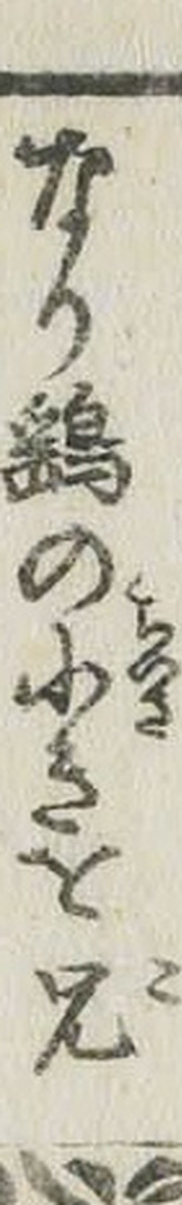なり鷂の小きを兄
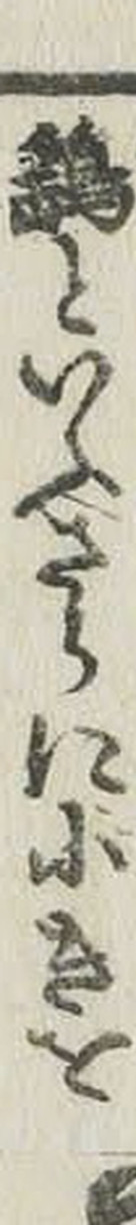鷂といふさらに小きを
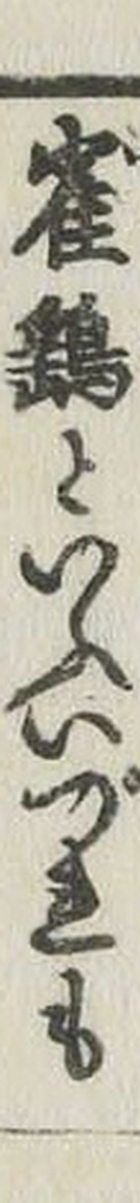雀鷂といふいづれも
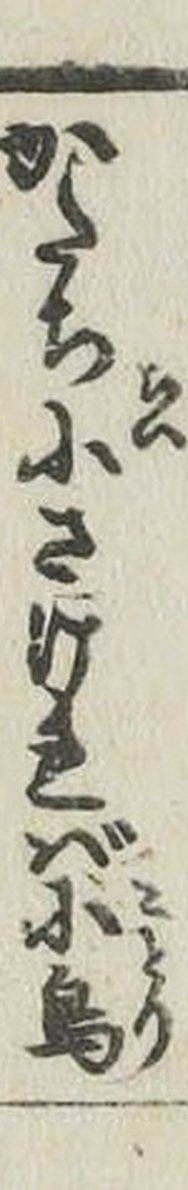かたち小さければ小鳥

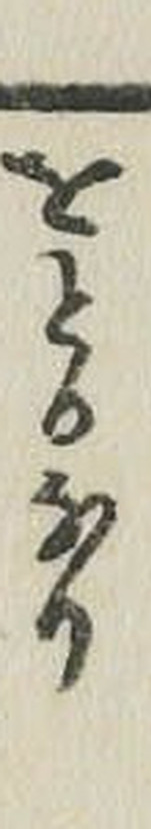をとるなり
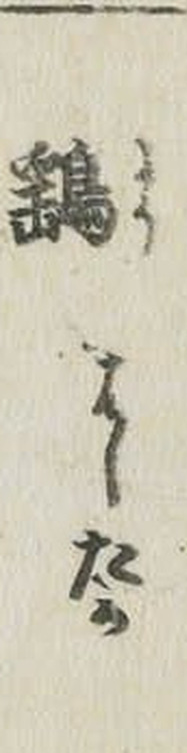鷂はしたか
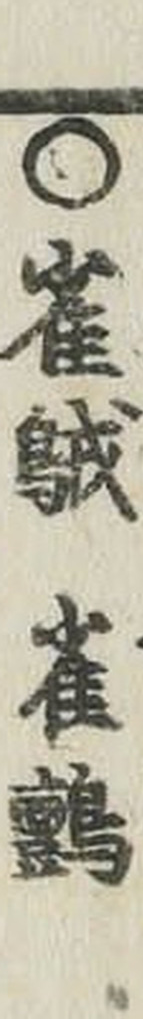○雀𪀚雀鸇
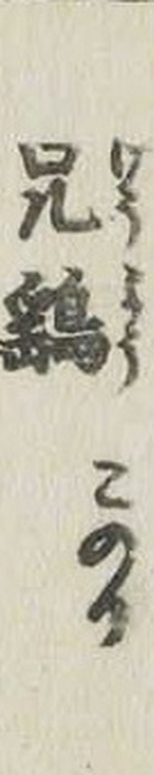兄鷂このり
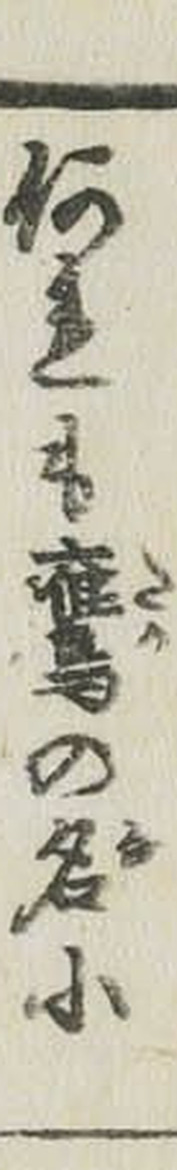何れも鷹の名小
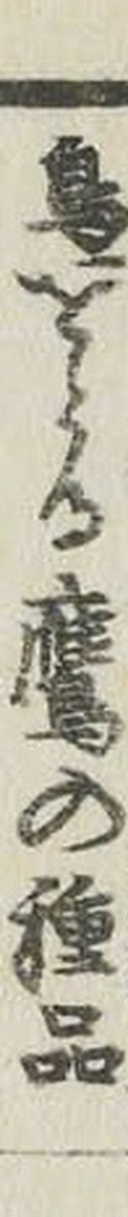鳥をとる鷹の種品
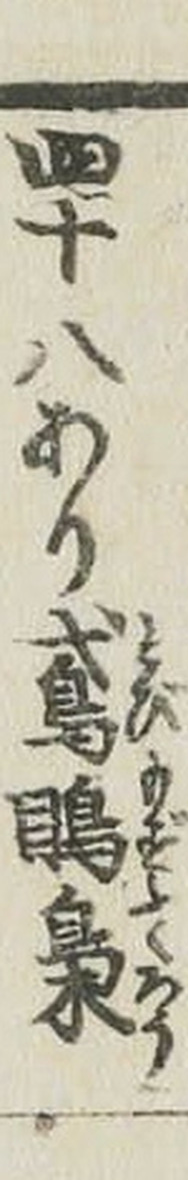四十八あり鳶鵙梟
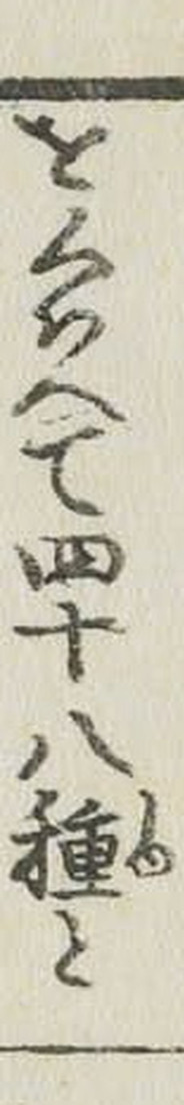をくはへて四十八種と
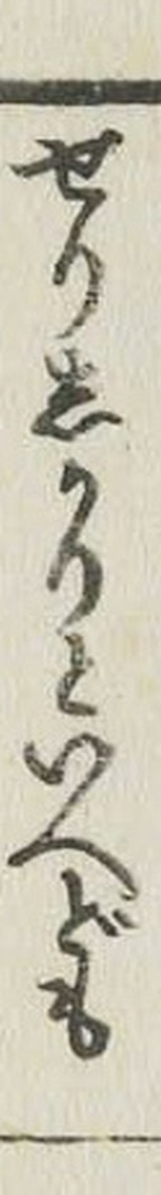せりしかりといへども
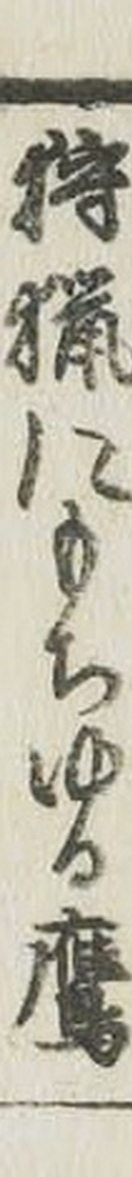狩猟にもちゆる鷹
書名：増補頭書訓蒙図彙大成 10巻 6:巻之12-13
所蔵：東京学芸大学教育コンテンツアーカイブ
